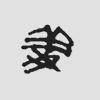義
